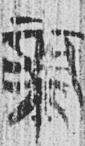帝
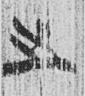之
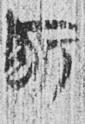所
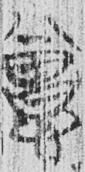憎
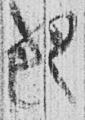母
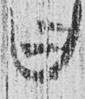○（冥）
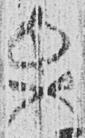冥冥
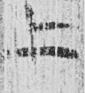上
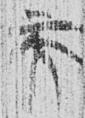天
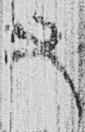又（有）
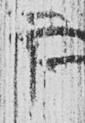下
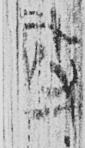政
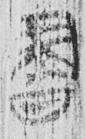晝
